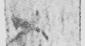五
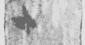十
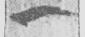一
